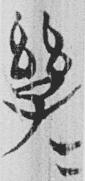孳孳
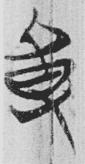尃（布）
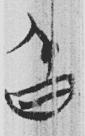昏（問）
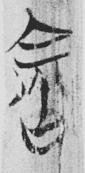○（余）
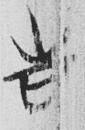告
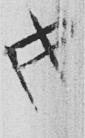女（汝）
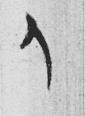人
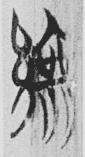綸（論）
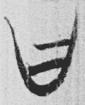曰
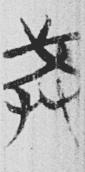戒
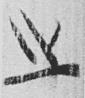之
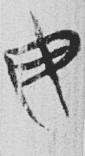母
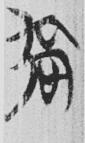喬（驕）
